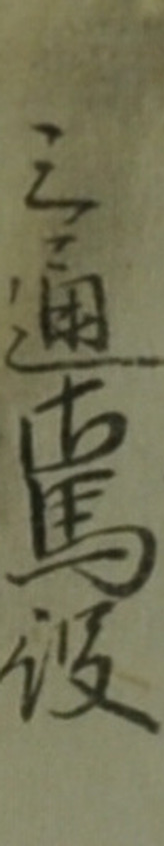之通御馬役
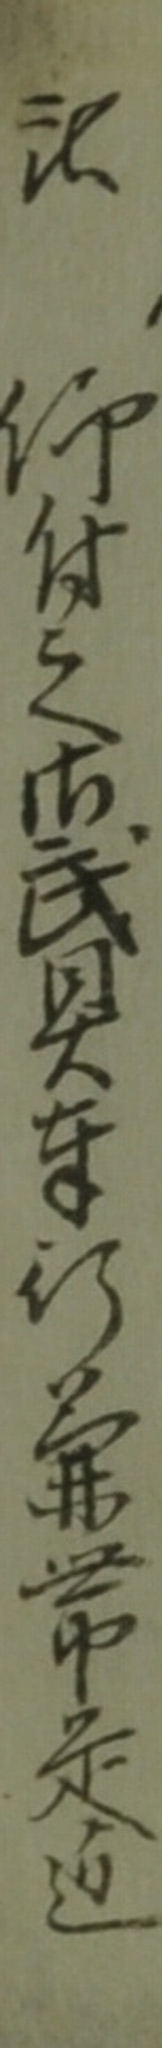被仰付之御武具奉行兼帯是迄

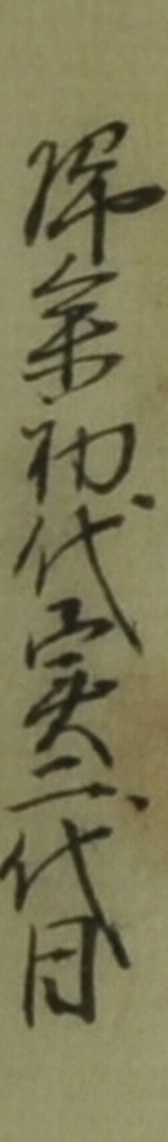帰参初代実二代目
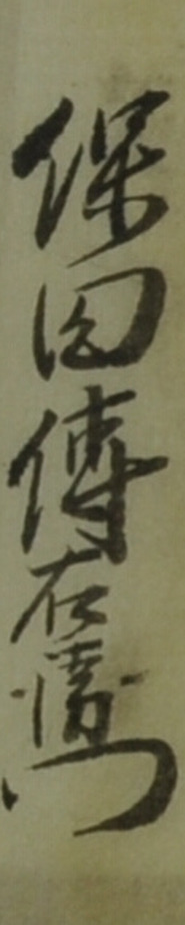保田傳右衛門
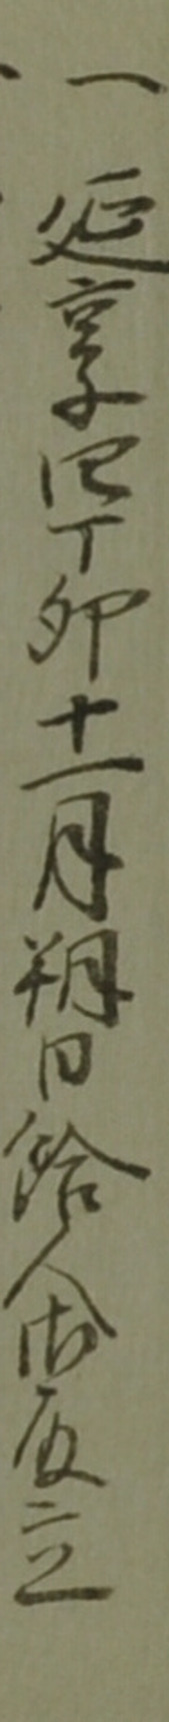一延享四丁卯十一月朔日給人御取立
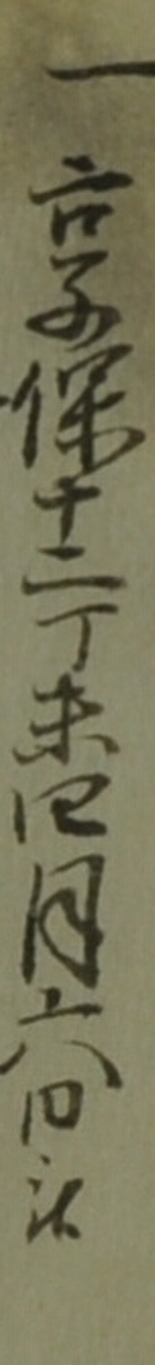一享保十二丁未四月六日被
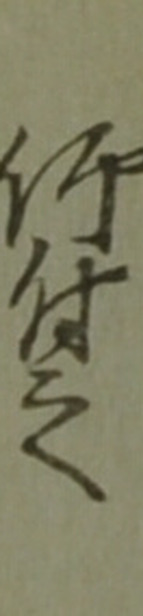仰付之
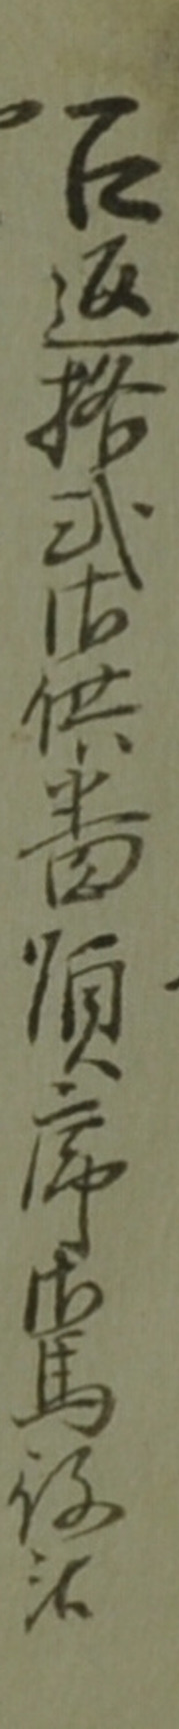召返格式御供番順席御馬役被
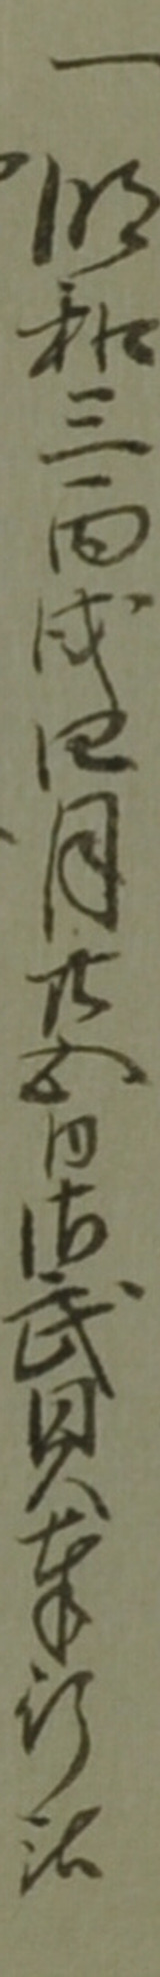一明和三丙戌四月廿五日御武具奉行被
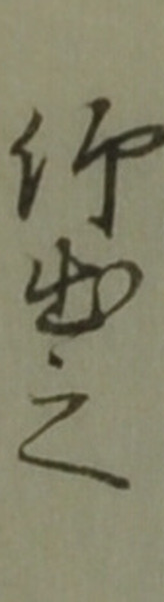仰出之
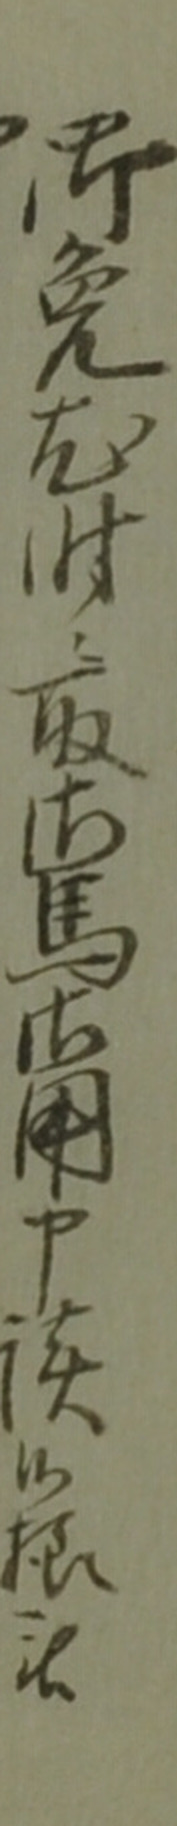御免尤時に取御馬御用申談候様被
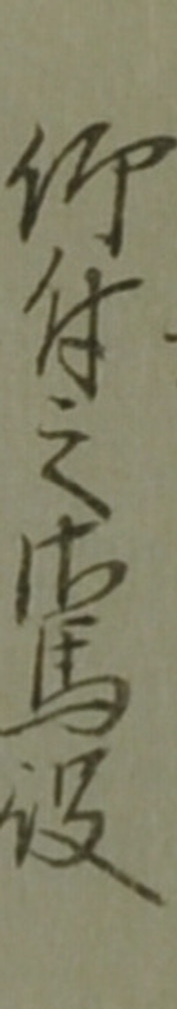仰付之御馬役
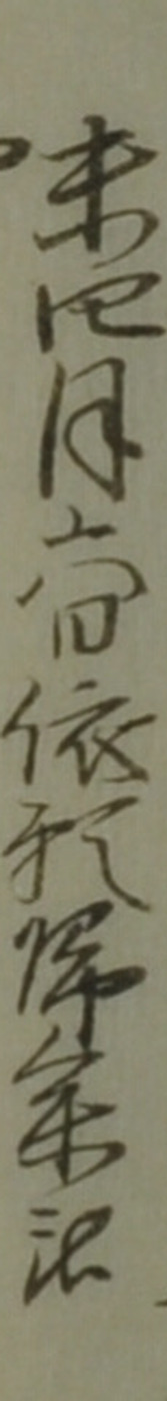未四月六日依願帰参被
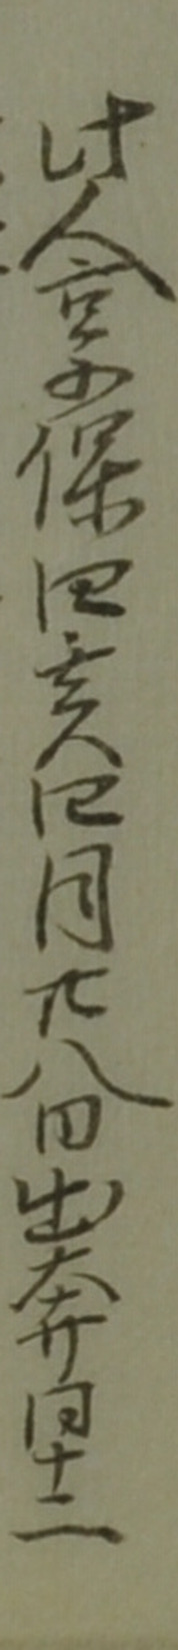此人享保四亥四月廿八日出奔同十二
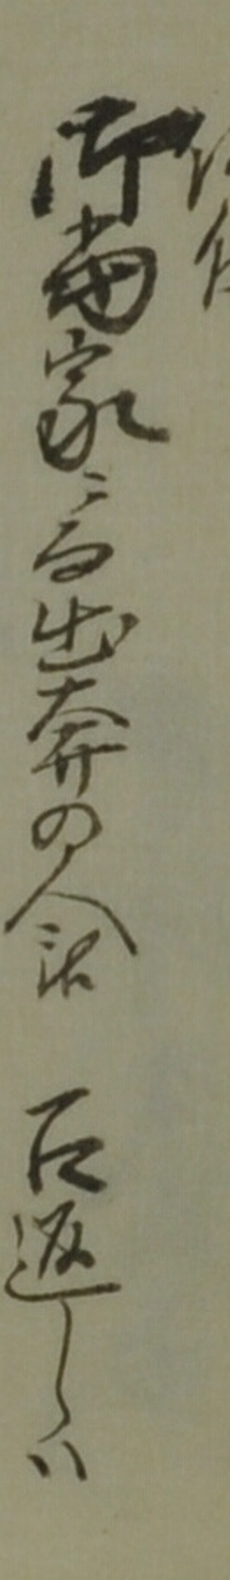御当家に而出奔の人被召返しは
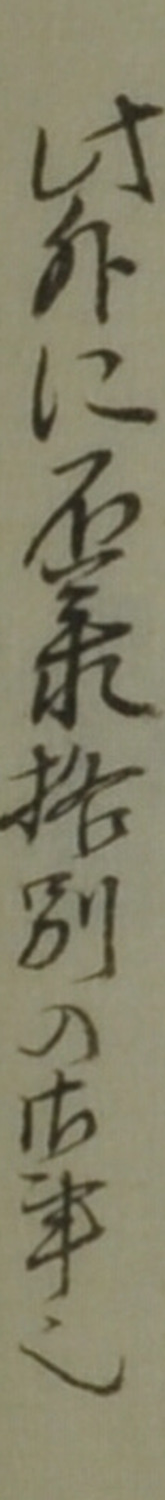此外に不承格別の御事也
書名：諸御役代々録（八）
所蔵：伊那市立高遠町図書館・合同会社AMANE
